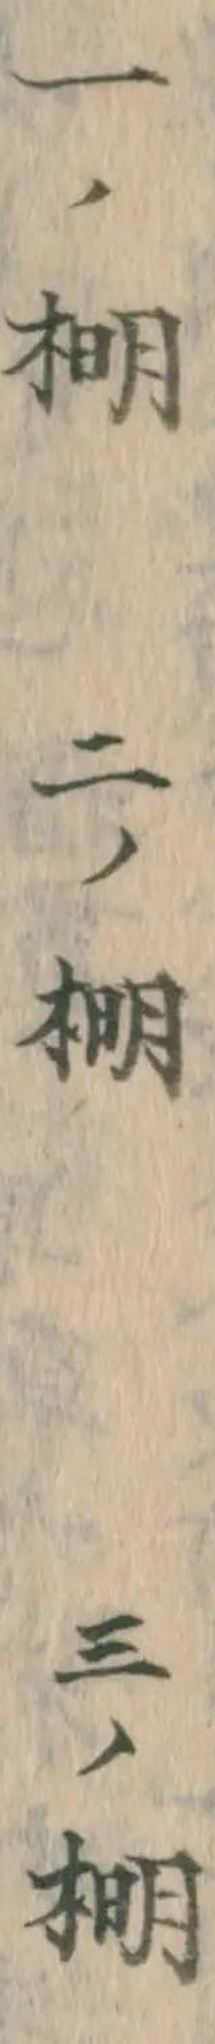一ノ棚二ノ棚三ノ棚
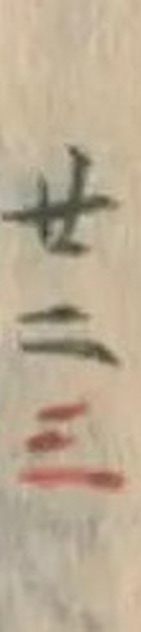廿二三

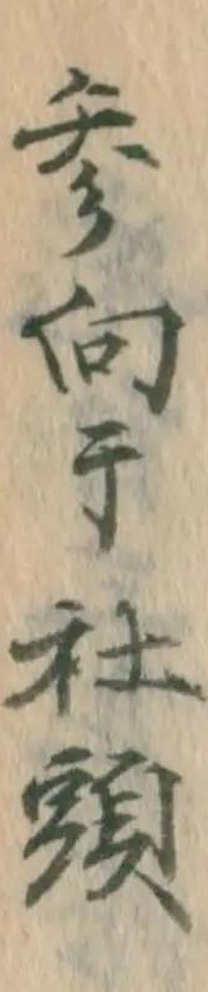参向于社頭

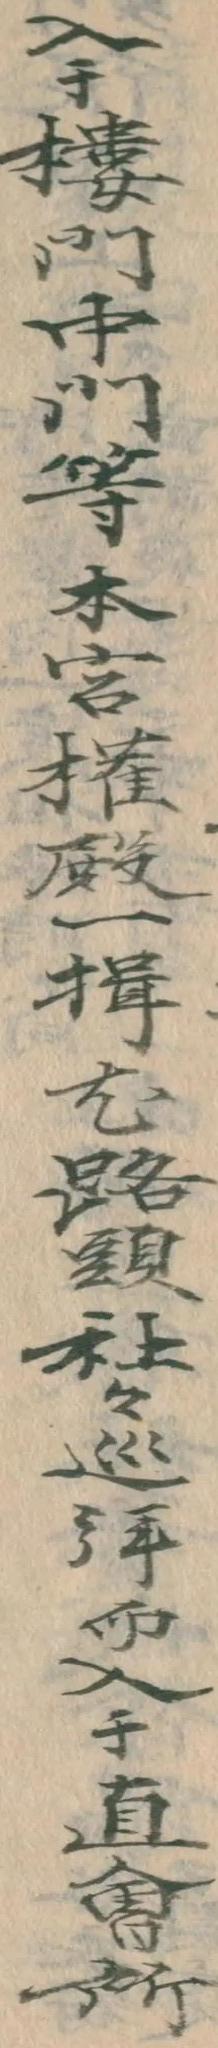入于楼門中門等本宮權殿一楫尤路頭社々巡拝而入于直会所
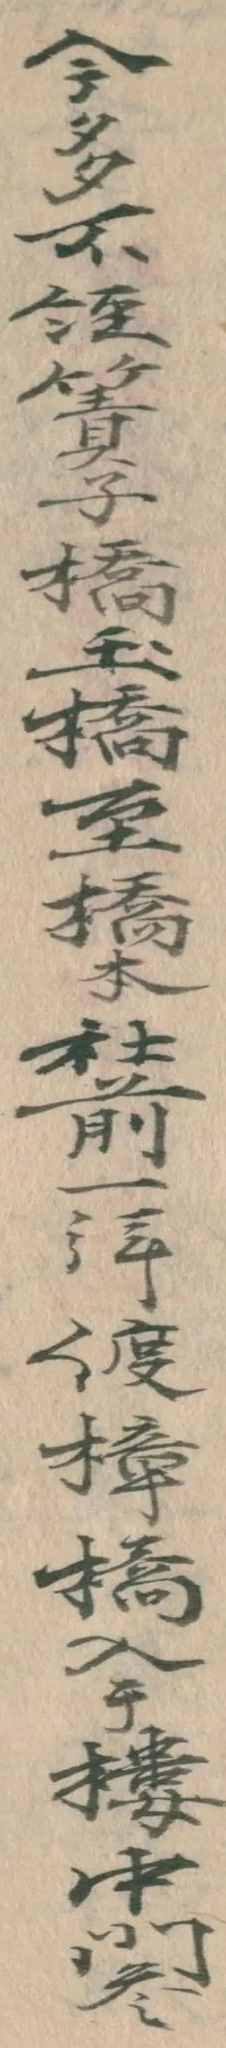今多不経簀子橋玉橋至橋本社前一拝渡樟橋入于楼中門参
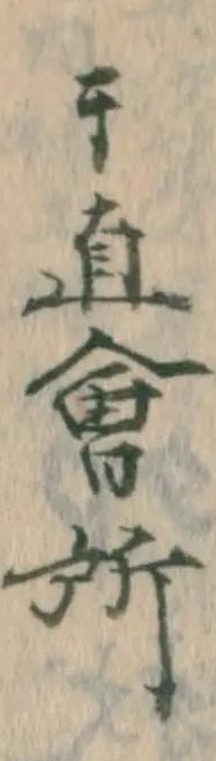于直会所
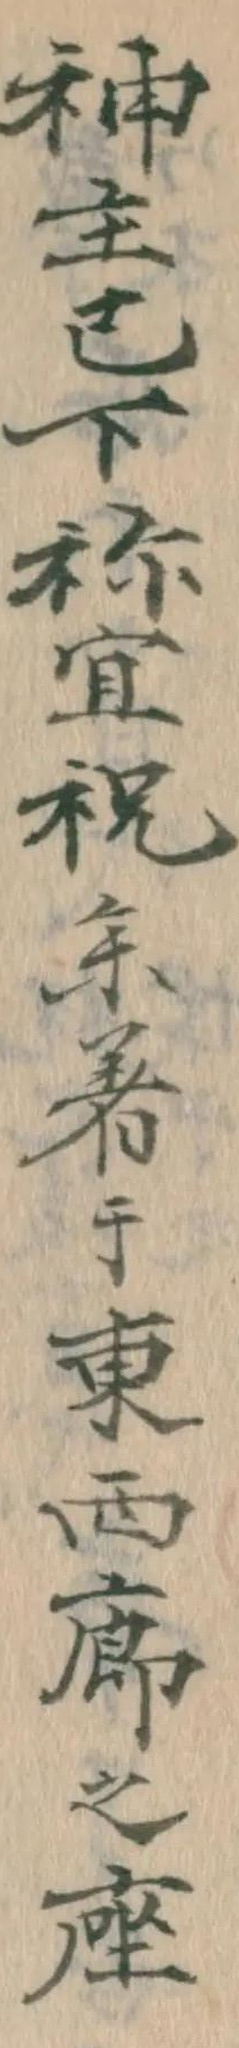神主已下祢宜祝参着于東西廊之座
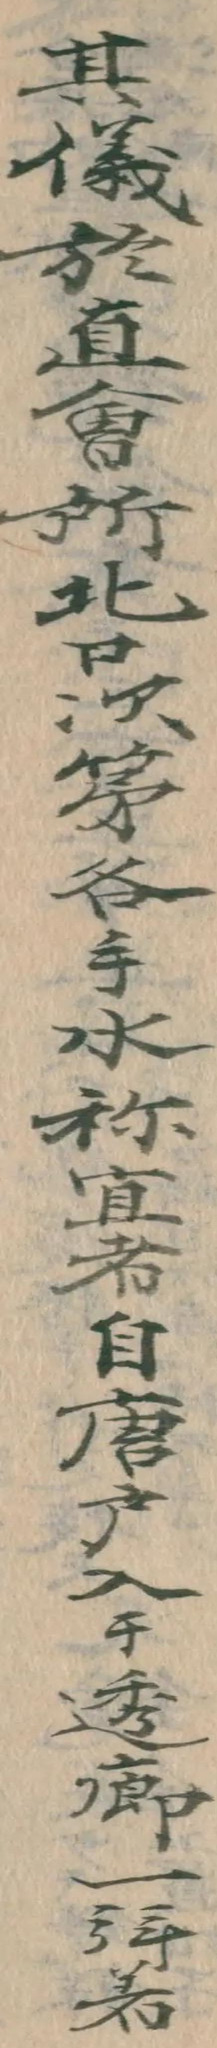其儀於直会所北口次第各手水祢宜者自唐戸入于透廊一拝着
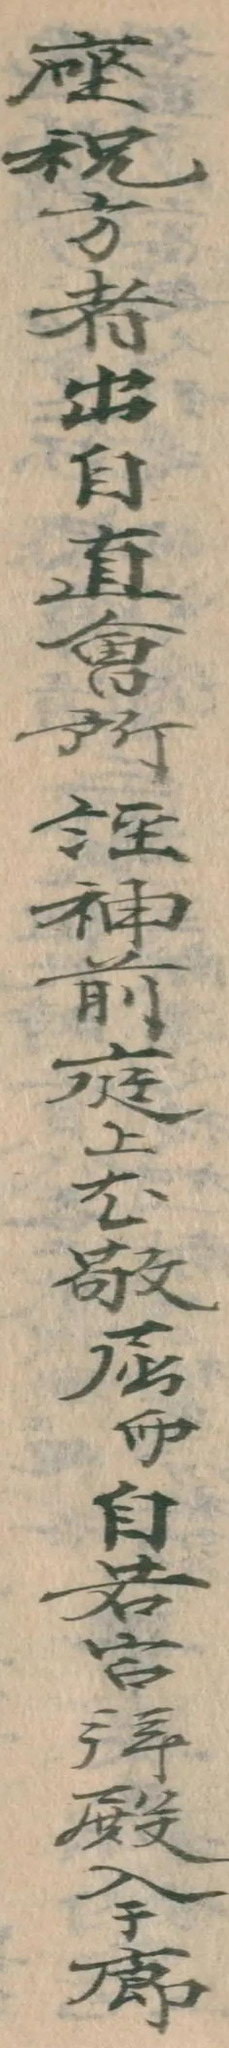座祝方者出自直会所経神前庭上尤敬屈而自若宮拝殿入于廊
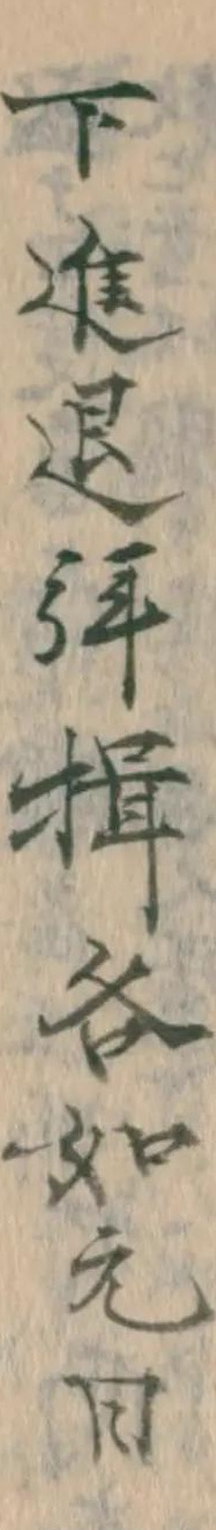下進退拝揖各如元日
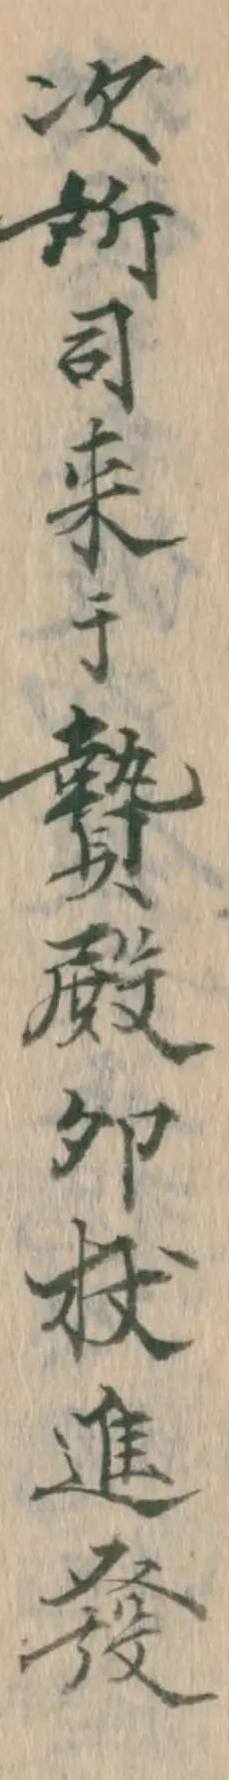次所司来于贅殿卯杖進発
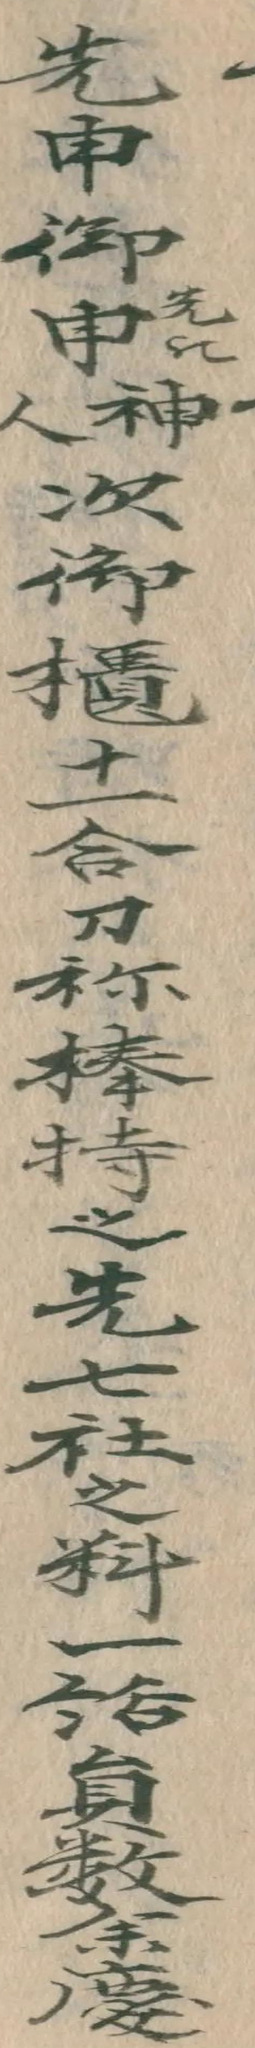先申御申神人次御櫃十一合刀祢棒持之先七社之料一給員数余慶
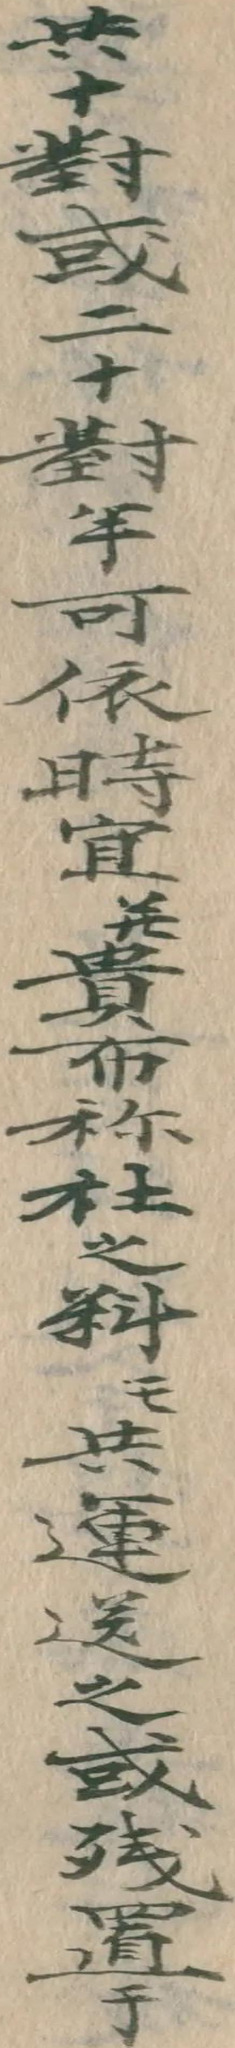共十対或二十対半可依時宜并貴ふね社之料モ共運送之或残置于
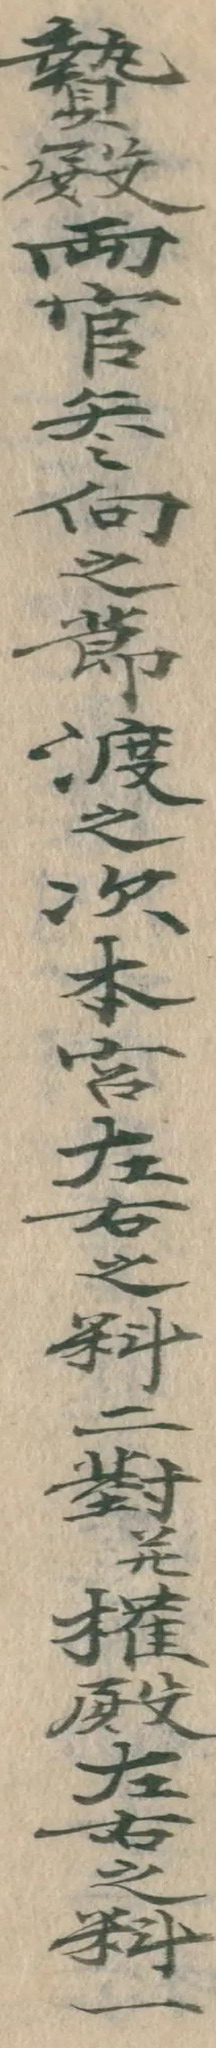贄殿両官参向之節渡之次本宮左右之料二対并権殿左右之料一
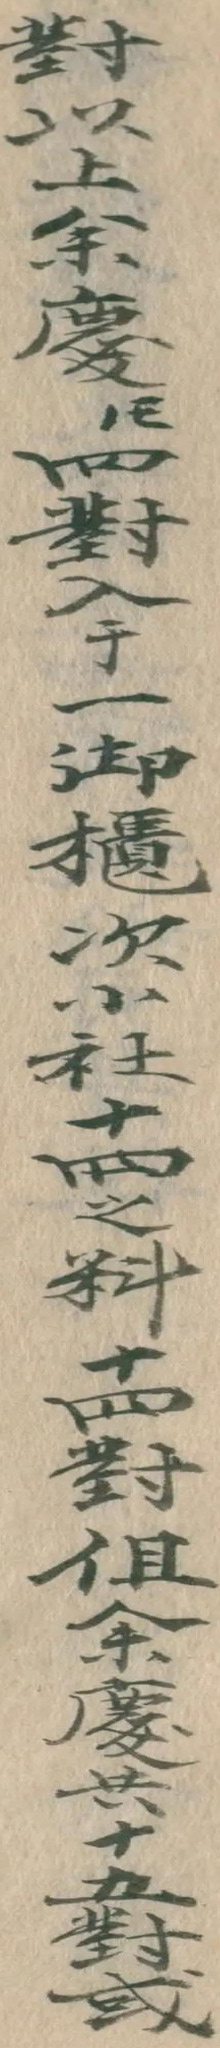対以上余慶トモ四対入于一御櫃次小社十四之料十四対但余慶共十五対或
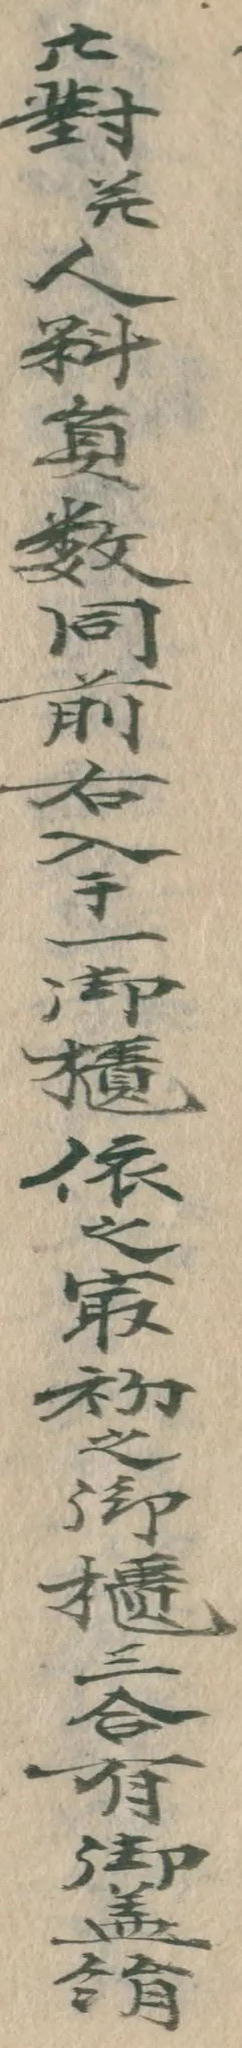廿対并人料員数同前右入于一御櫃依之最初之御櫃三合有御盖絹
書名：賀茂社記録. 第9冊
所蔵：国立国会図書館 National Diet Library, JAPAN
